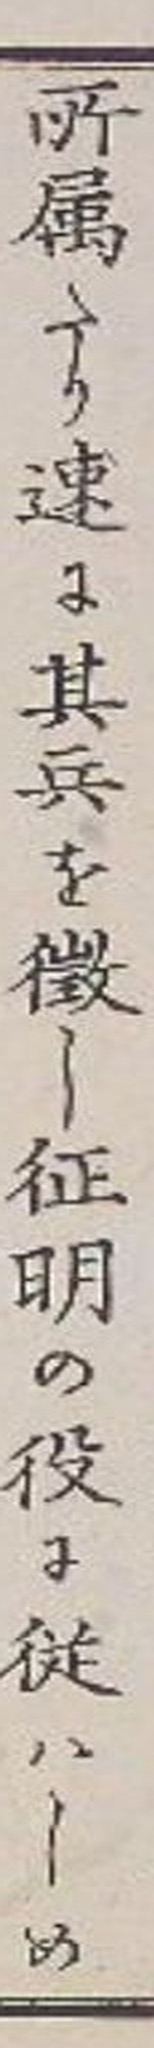所属たり速に其兵を徴し征明の役に従はしめ
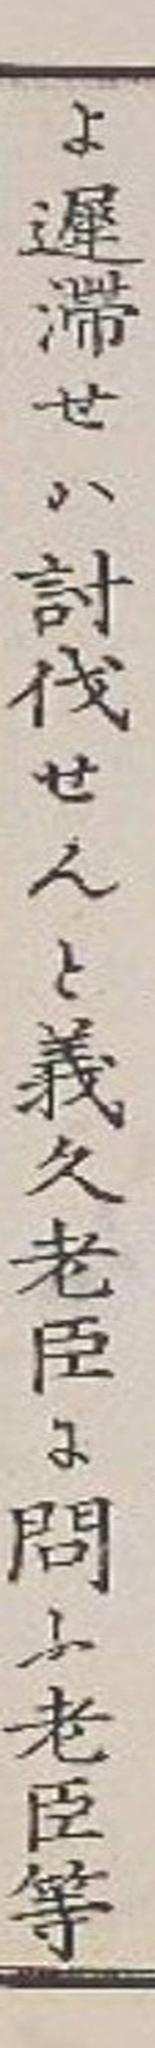よ遅滞せは討伐せんと義久老臣に問ふ老臣等
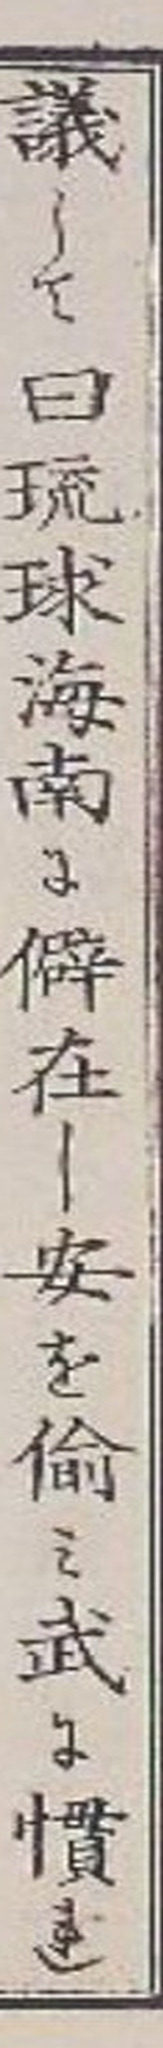議して曰琉球海南に僻在し安を偸み武に慣れ
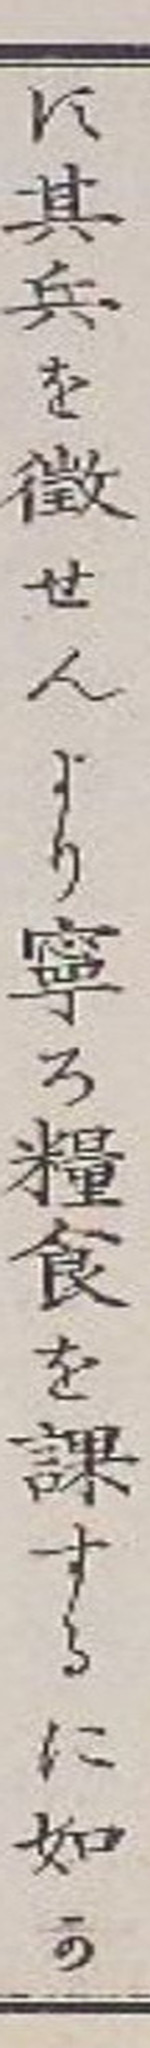す其兵を徴せんより寧ろ糧食を課するに如か
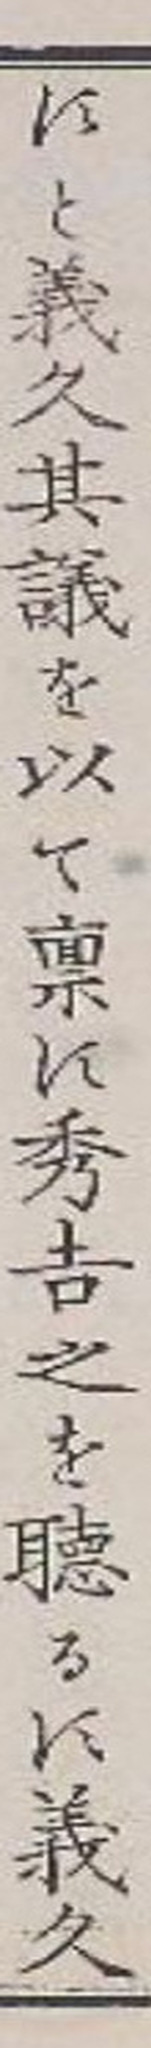すと義久其議を以て稟す秀吉之を聴るす義久
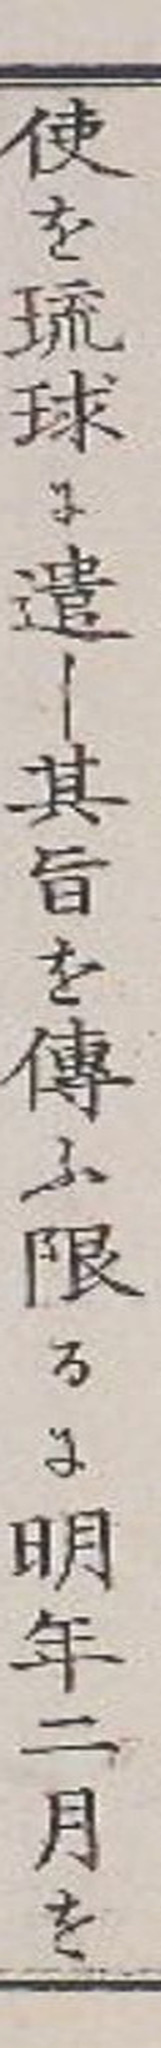使を琉球に遣し其旨を伝ふ限るに明年二月を
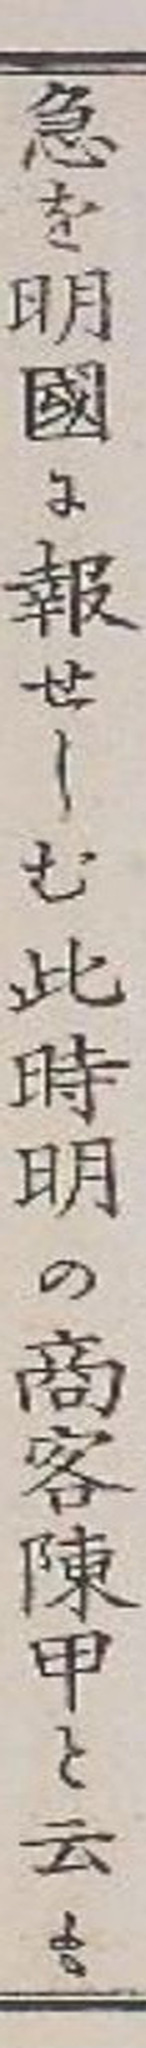急を明国に報せしむ此時明の商客陳甲と云も
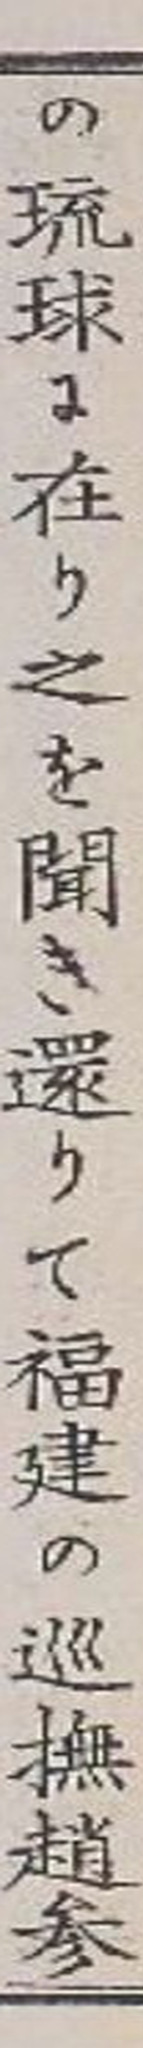の琉球に在り之を聞き還りて福建の巡撫趙参
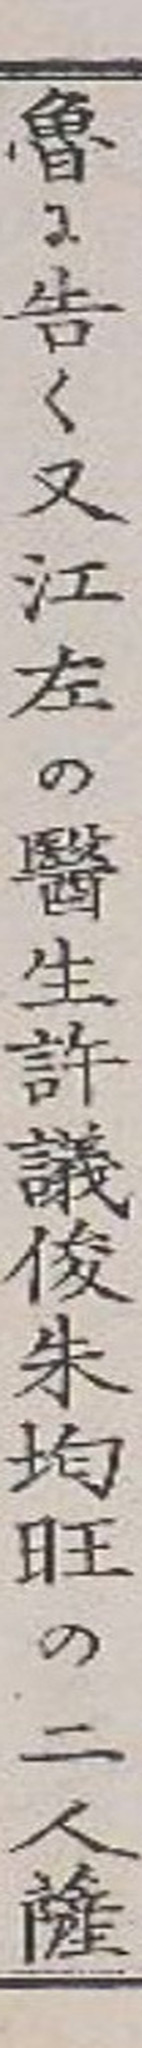魯に告く又江左の医生許議俊朱均旺の二人薩
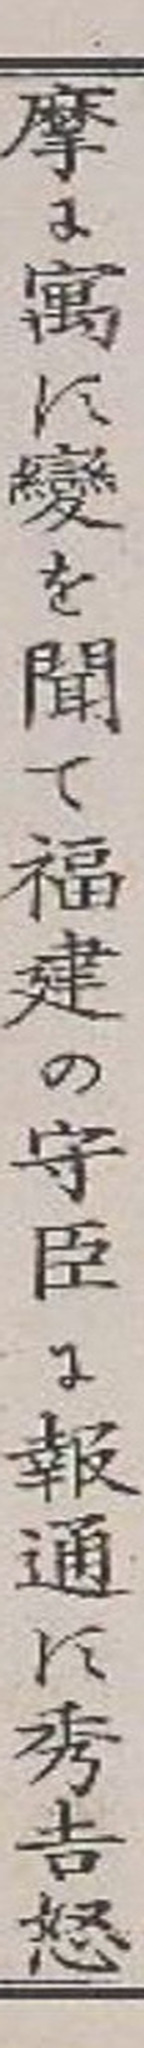摩に寓す変を聞て福建の守臣に報通す秀吉怒
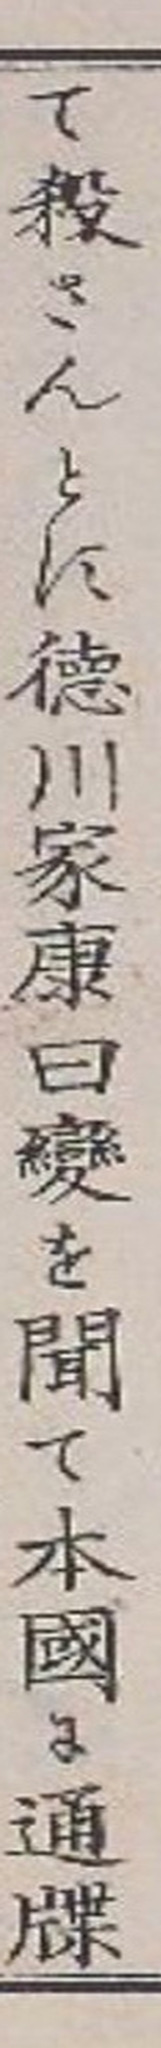て殺さんとす徳川家康曰変を聞て本国に通牒

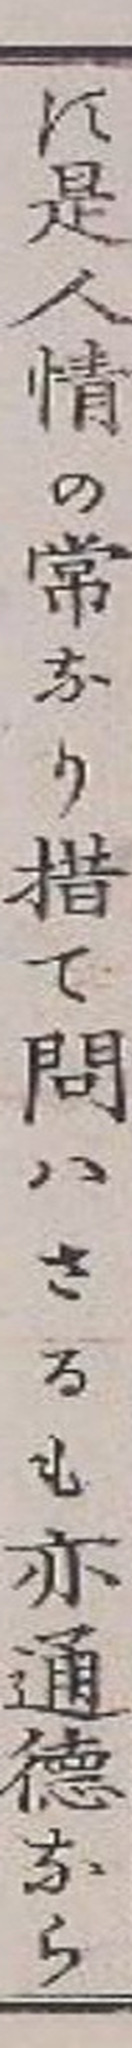す是人情の常なり措て問はさるも亦通徳なら
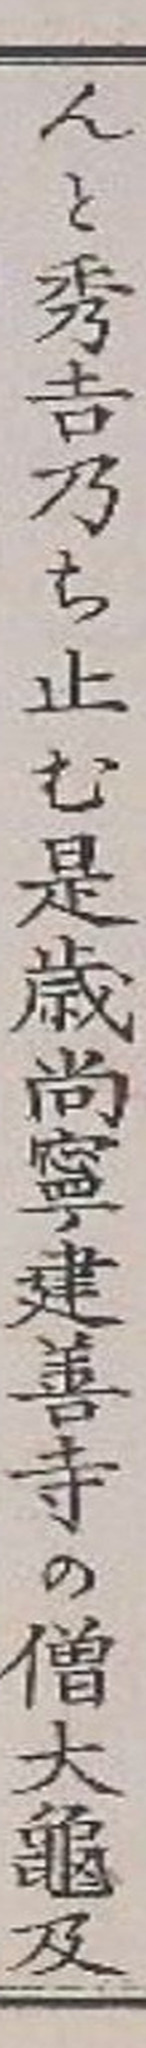んと秀吉乃ち止む是歳尚寧建善寺の僧大亀及
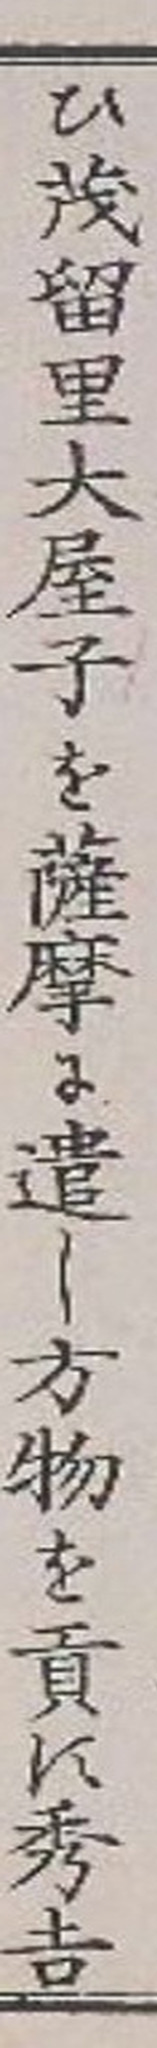ひ茂留里大屋子を薩摩に遣し方物を貢す秀吉
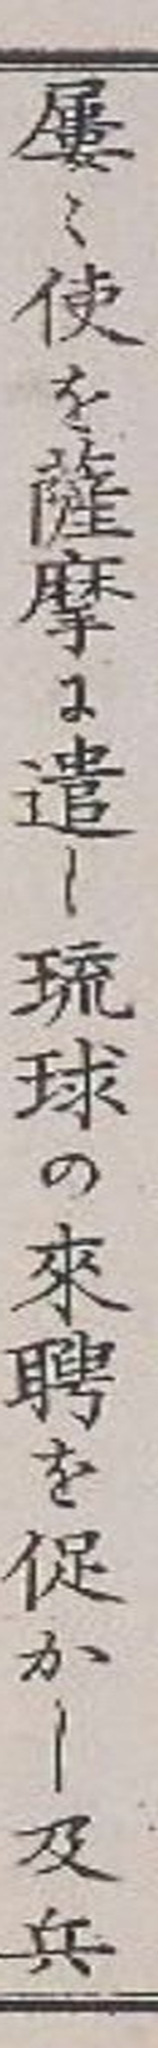屡々使を薩摩に遣し琉球の来聘を促かし及兵
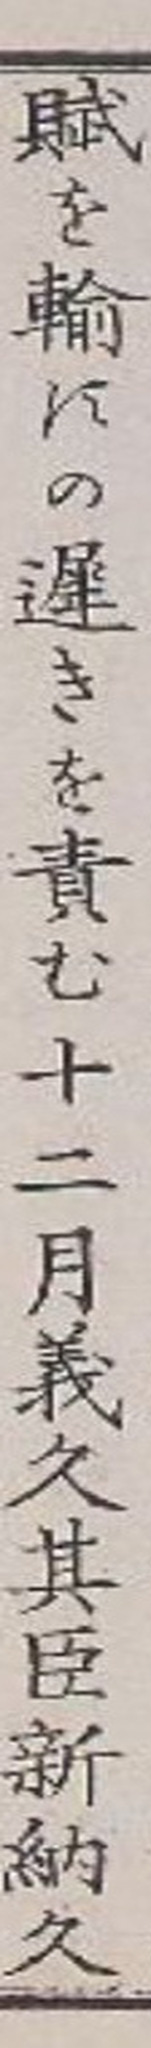賦を輸すの遅きを責む十二月義久其臣新納久
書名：南島紀事 中
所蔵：University of the Ryukyus Library
